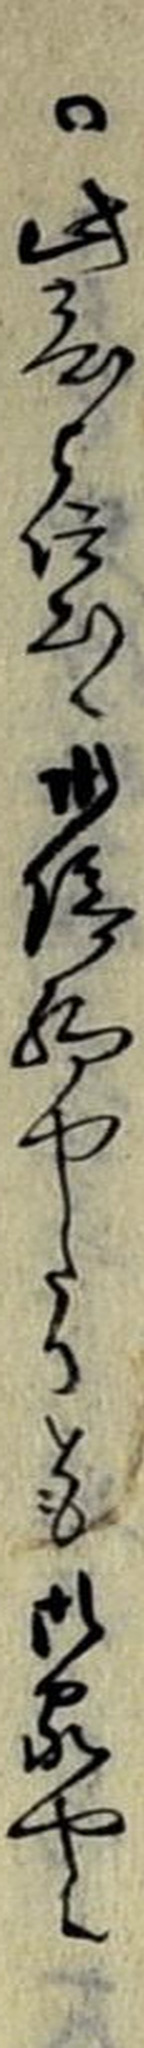〇此度被仰出候御倹約中たりとも御家中之御用人
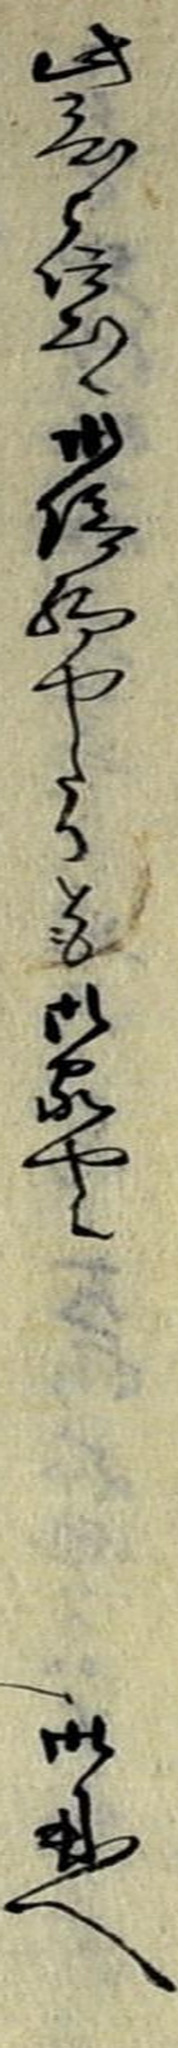〇此度被仰出候御倹約中たりとも御家中之御用人
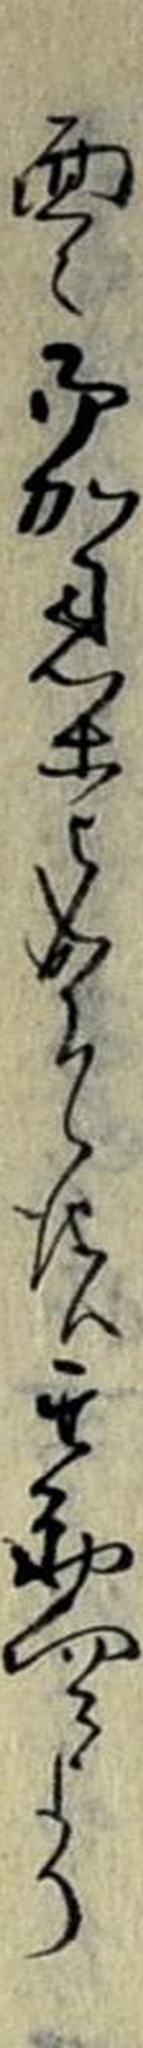面々御加恩等被成下候儀は其勤向により御奉行
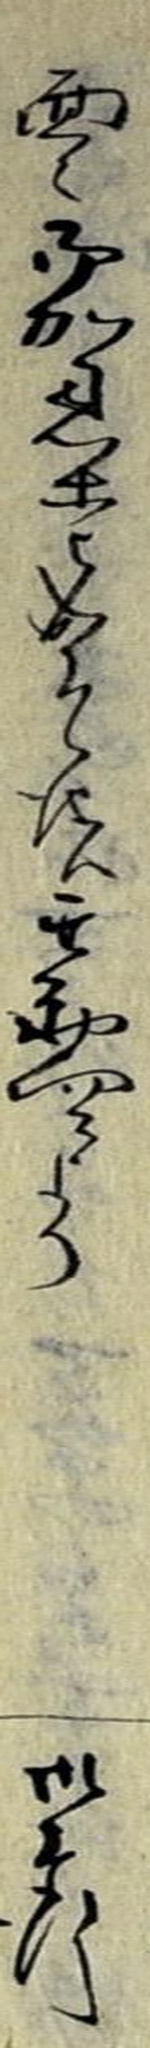面々御加恩等被成下候儀は其勤向により御奉行
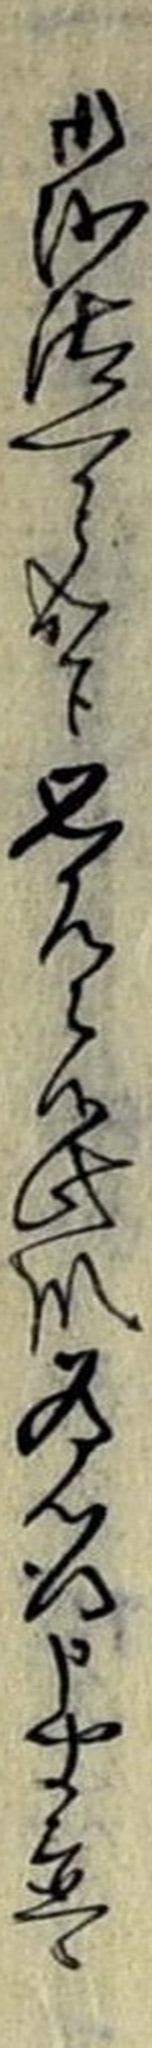御沙汰可被成下思召に候此段為心得申聞置候御目付
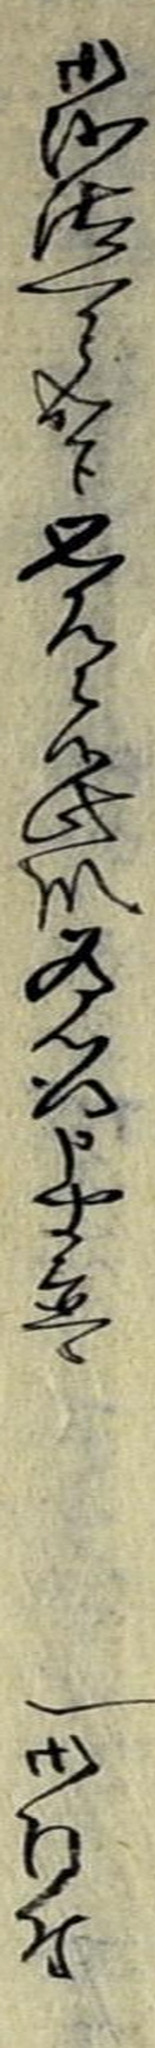御沙汰可被成下思召に候此段為心得申聞置候御目付
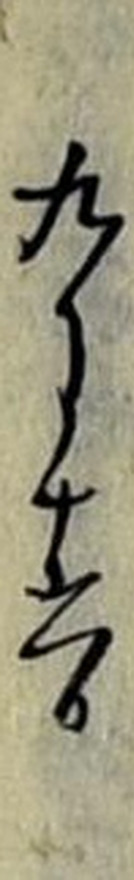九月十六日
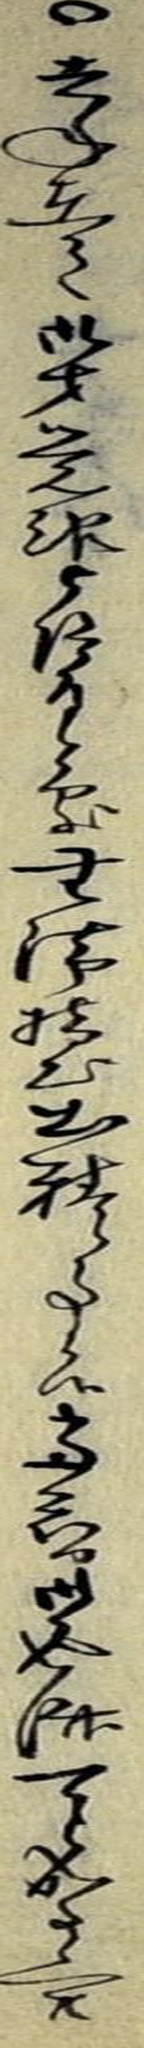〇去年在々へ御才覚銀被仰付候処無滞指出出精候事に候当暮御返済可被成事候へ共
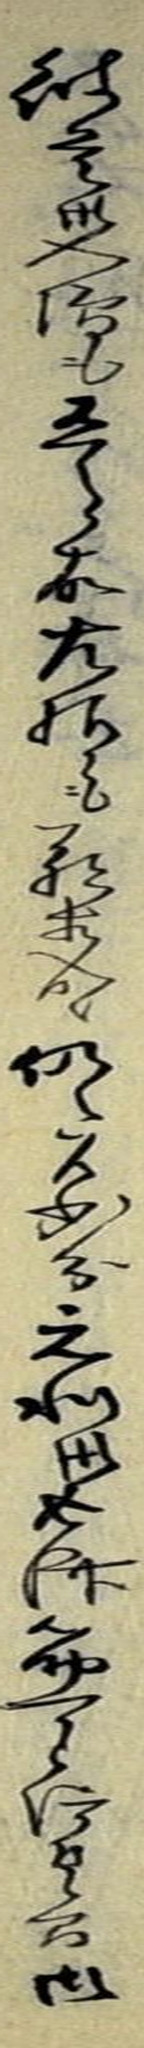彼是御入増も有之候故左様にも難相成候仍之乍少分元利御返済筋可被仰付候間御
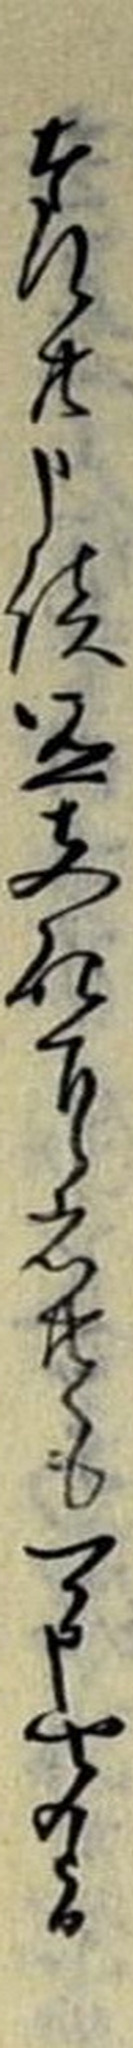奉行共申談宜支配下之者共へも可申聞旨
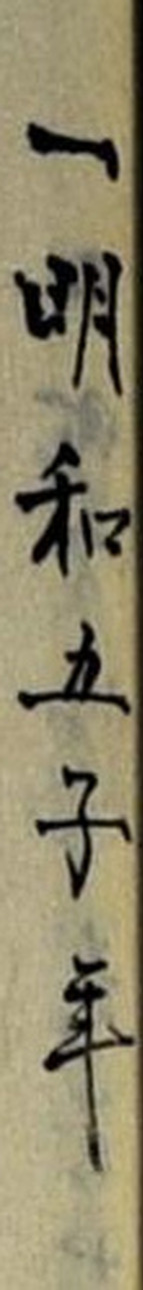一明和五子年
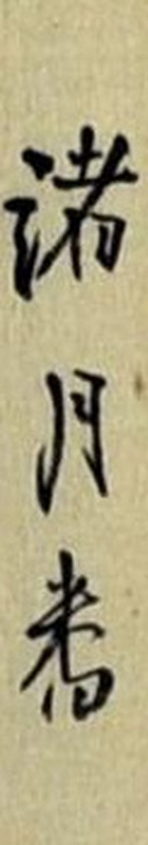諸月番
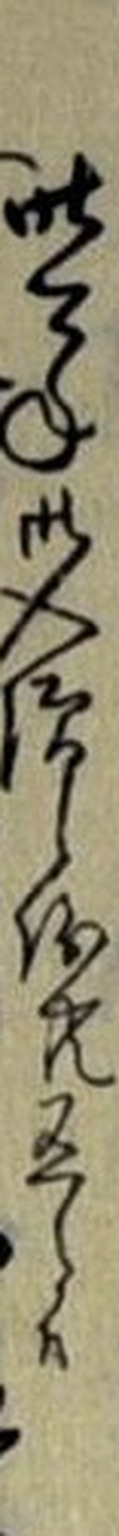昨今年御入増之儀共有之に付
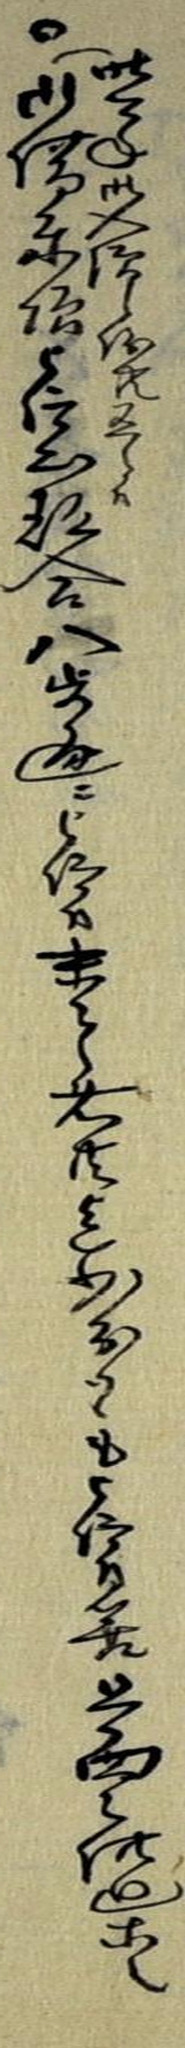〇御借米増被仰出都合八歩通に被仰付末々之者共迄少分ツヽも被仰付筈且面々供廻等之
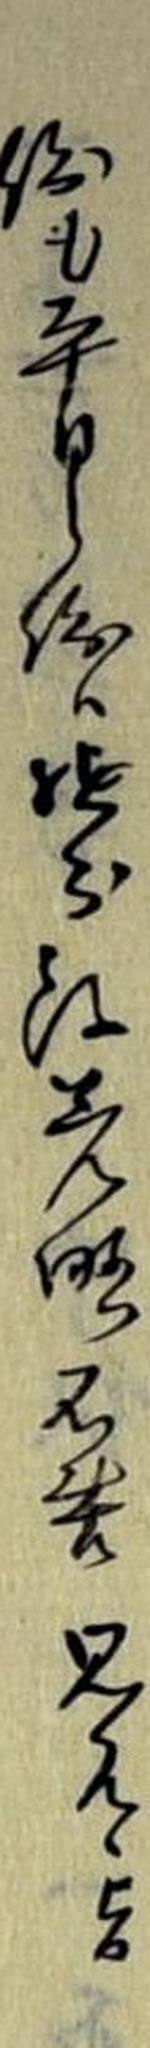儀も平日之儀は随分致差略不苦思召候旨
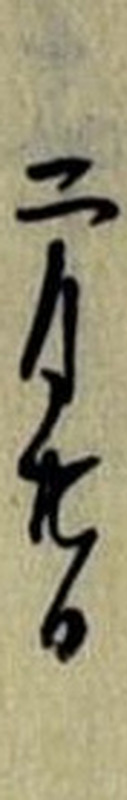二月廿日
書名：命令之部 二
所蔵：福井県文書館 Fukui Prefectural Archives
